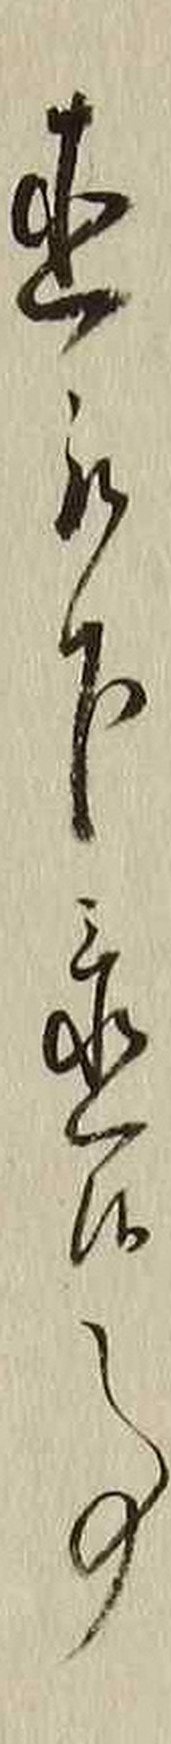直被下置候事
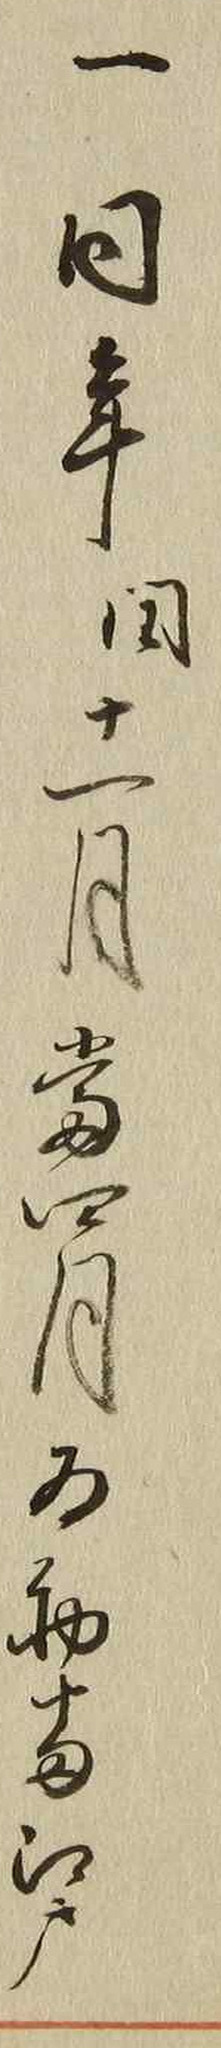一同年閏十一月当四月為勤番江戸
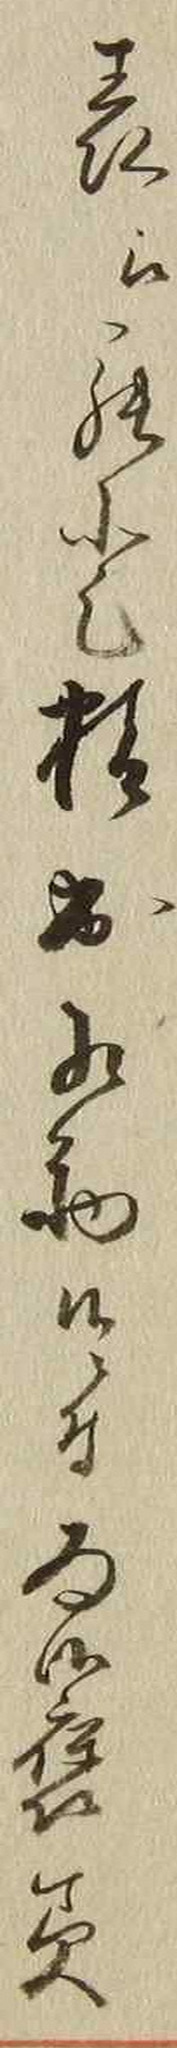表江罷登精出相勤候ニ付為御褒美
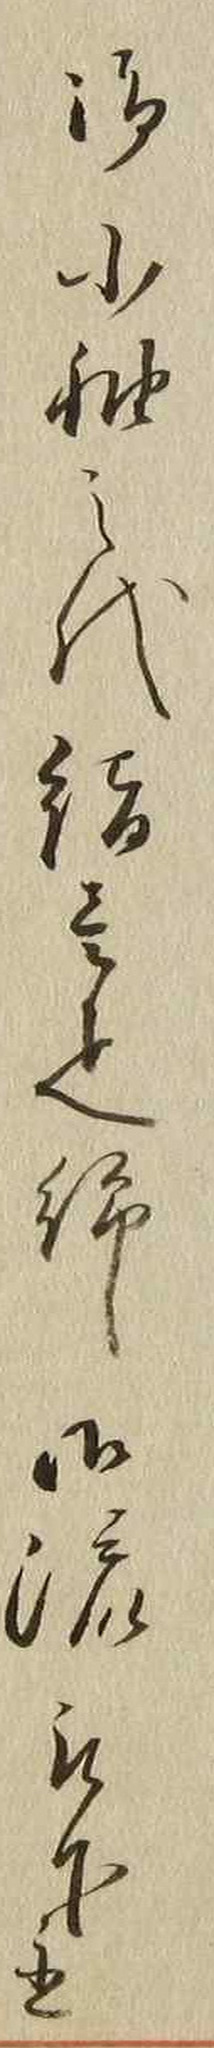御小袖之代絹壱疋綿御流被下置
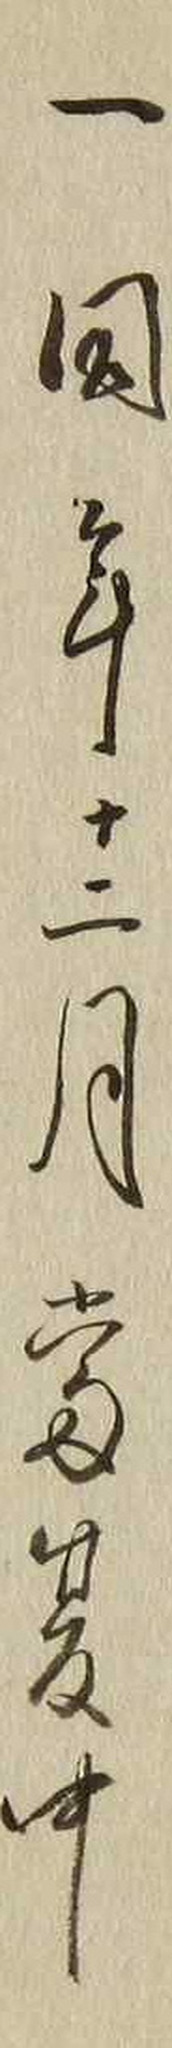一同年十二月当夏中
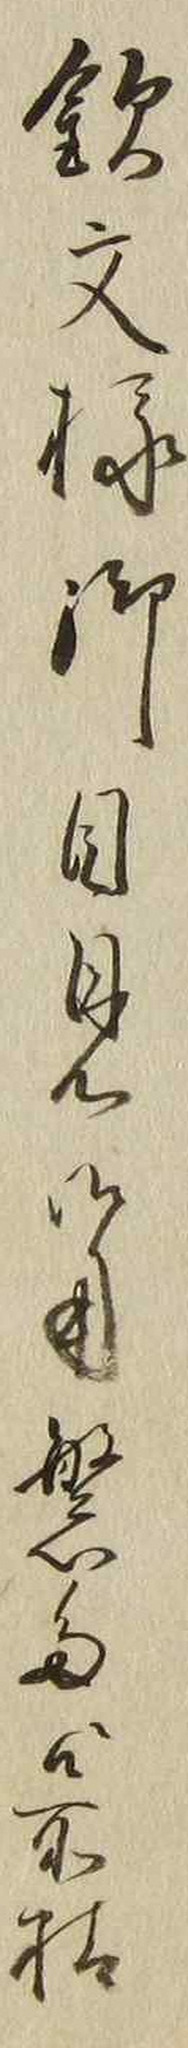欽文様御目見御用繫多ニ候所精
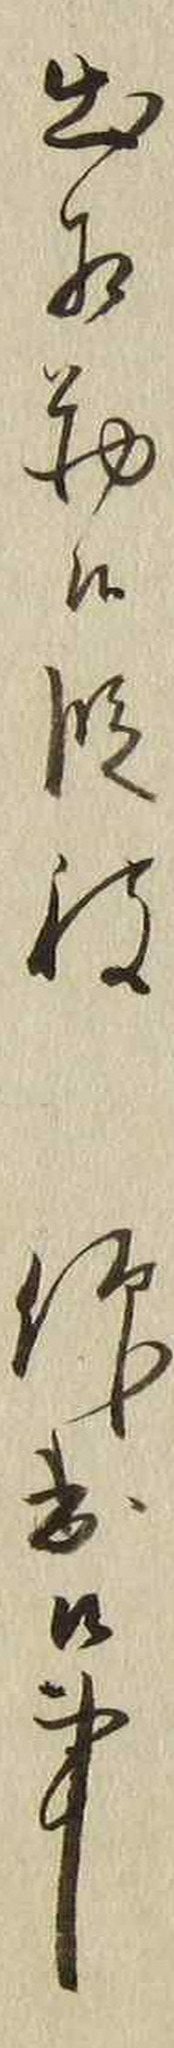出相勤候段被仰出候事
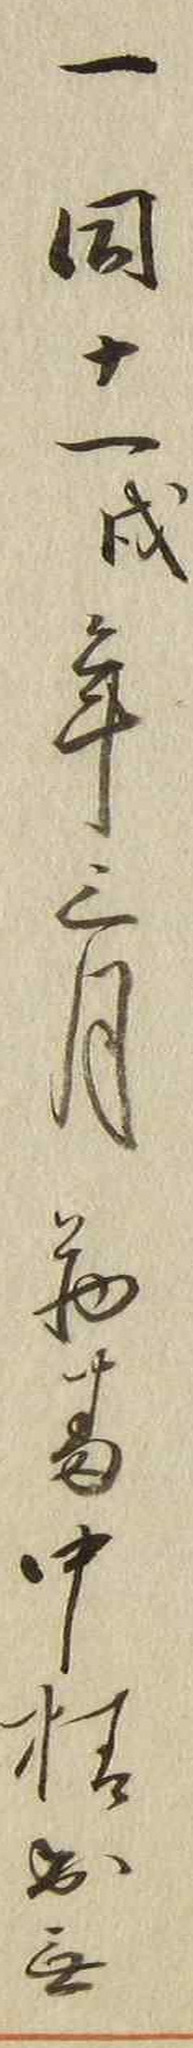一同十一戌年三月勤番中精出無
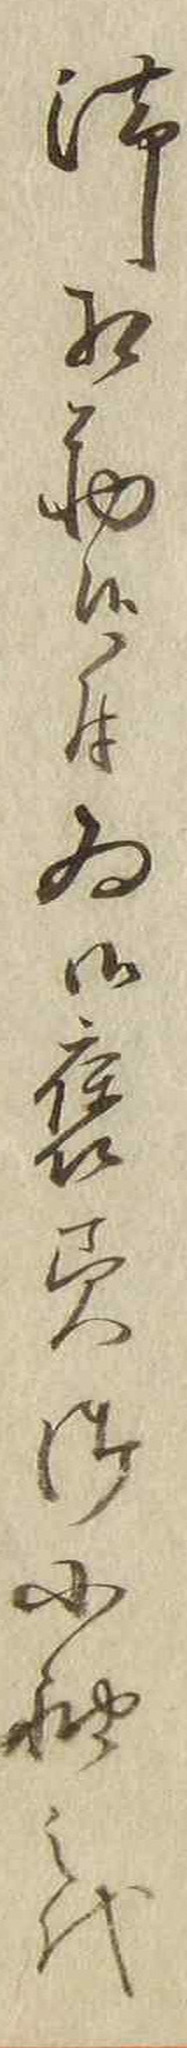滞相勤候ニ付為御褒美御小袖之代
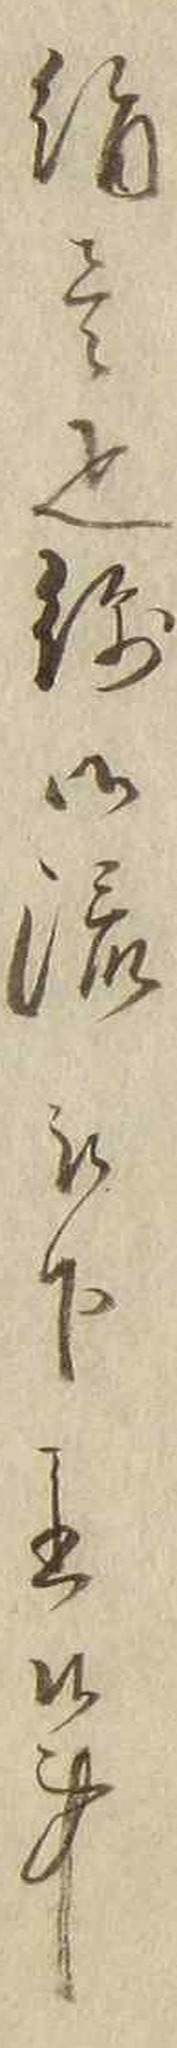絹壱疋綿御流被下置候

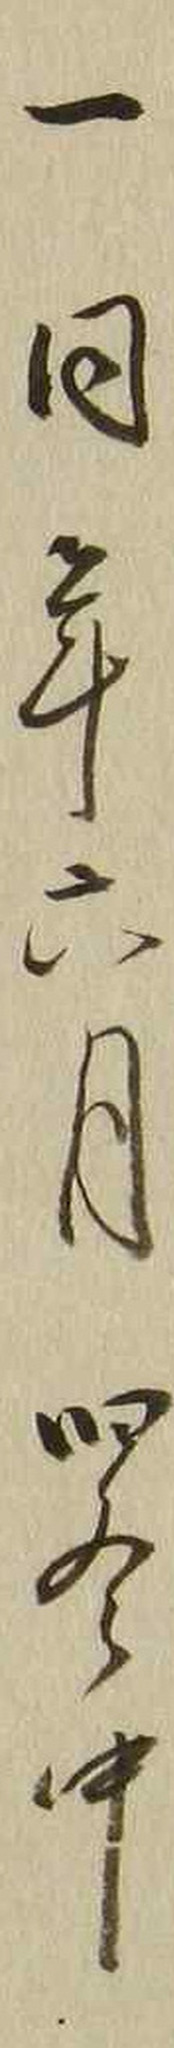一同年六月旧冬中
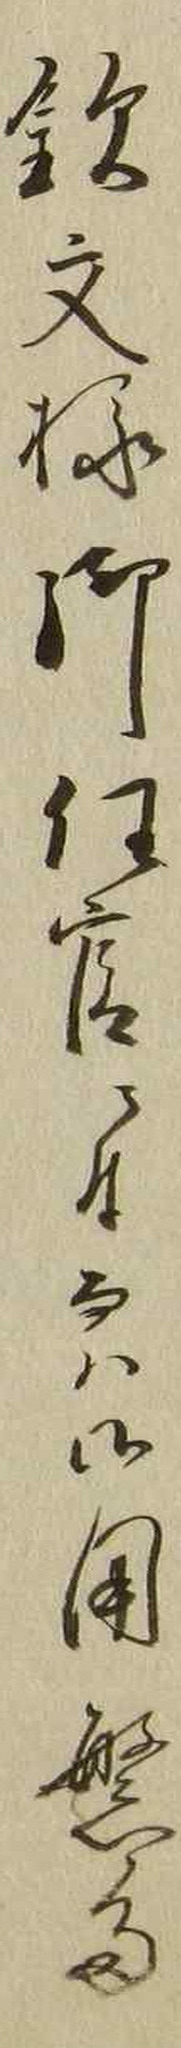欽文様御任官ニ付而ハ御用繫多
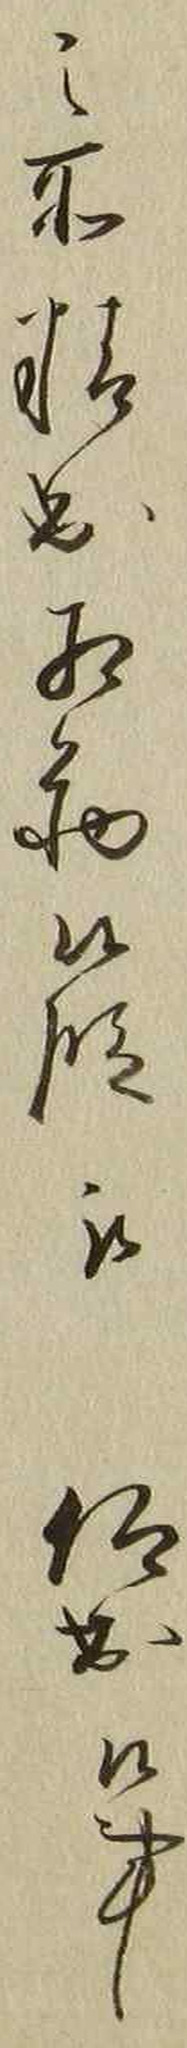之所精出相勤候段被仰出候事
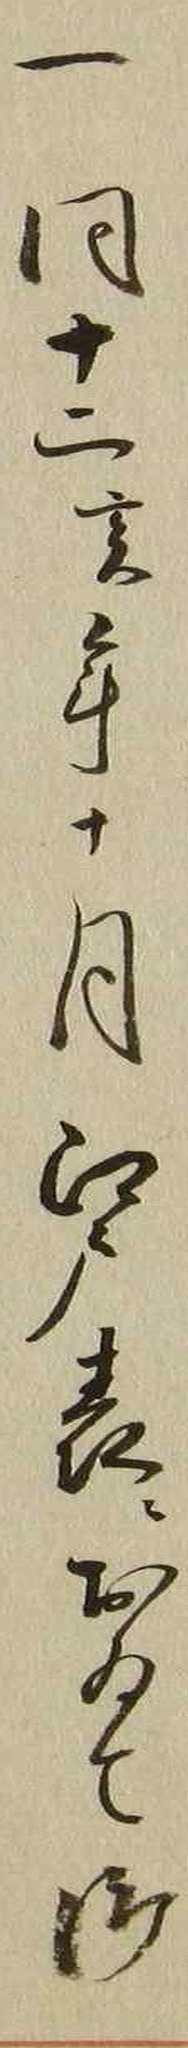一同十二亥年十月江戸表ニおいて御
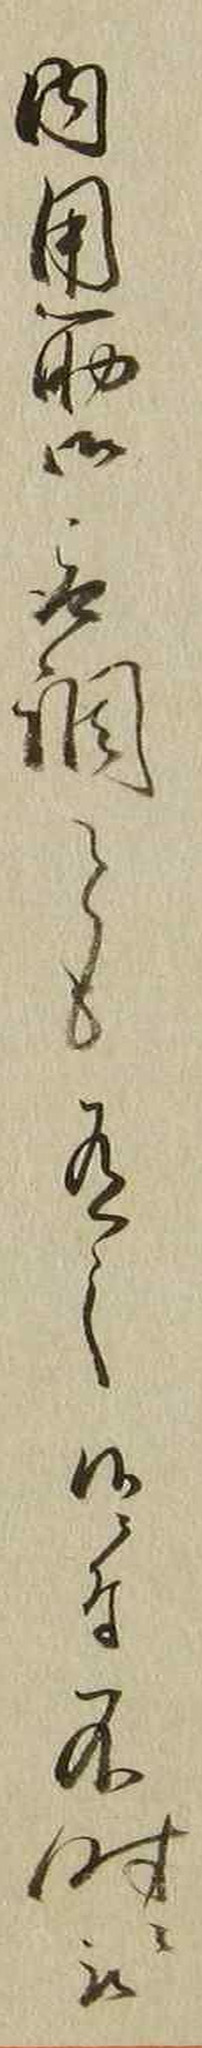内用筋被御取調とも有之候ニ付不時ニ被
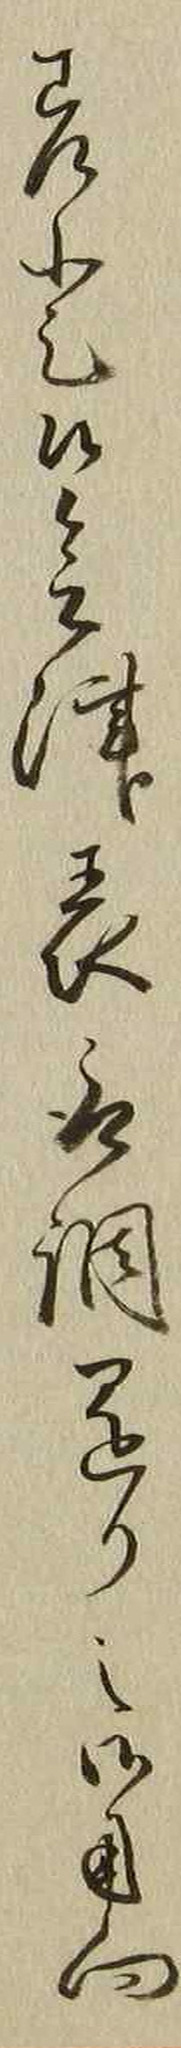差登候会津表取調懸り之御用向
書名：諸士系譜　巻之68　を之部2
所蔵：会津若松市立会津図書館
